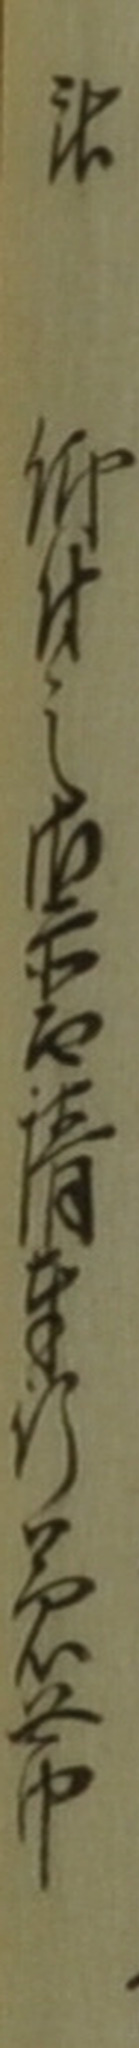被仰付之御普請奉行兼帯
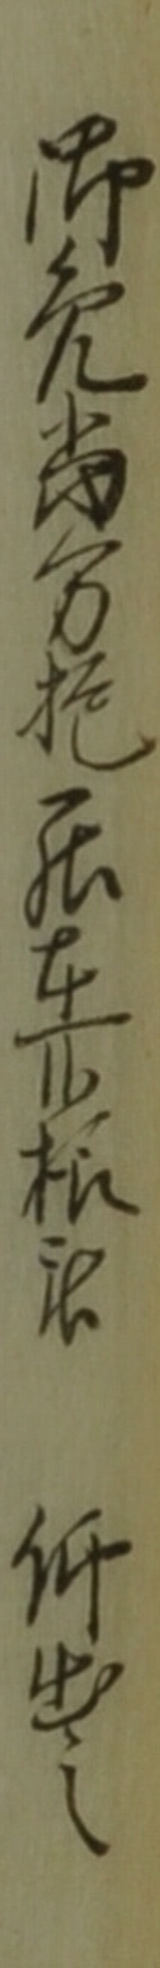御免当分抱罷在候様被仰出之
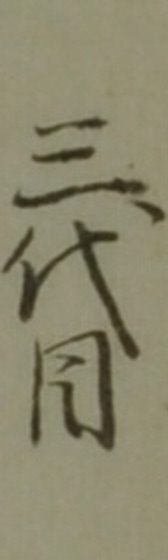三代目
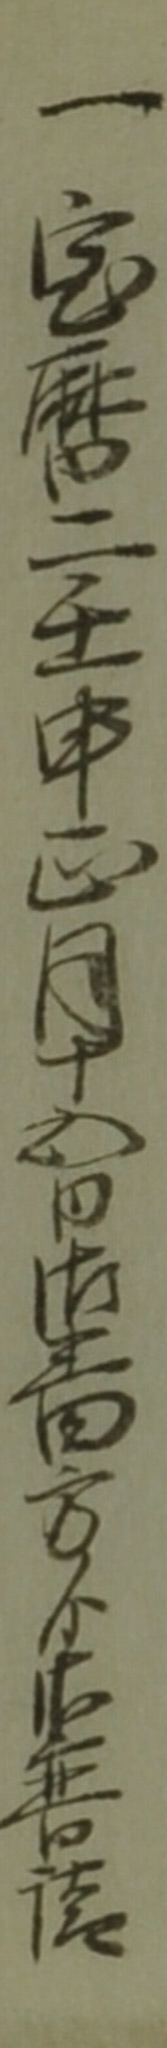一宝暦二壬申正月十五日御番方ゟ御普請
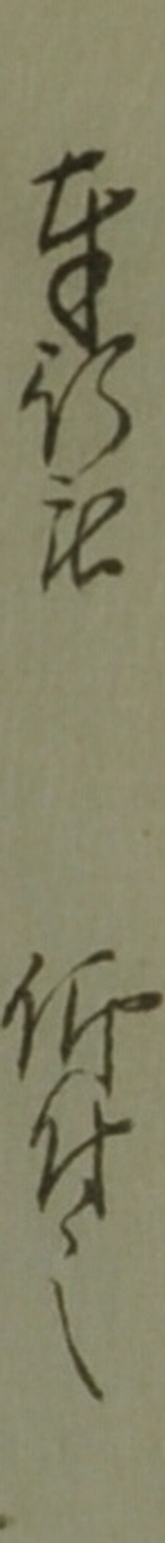奉行被仰付之
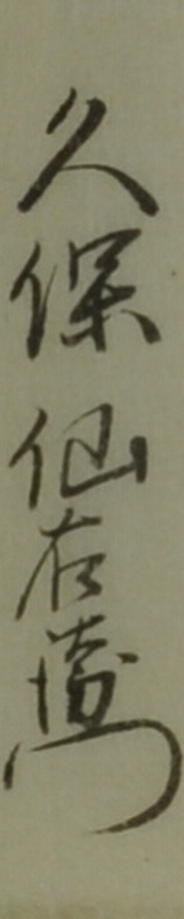久保仙右衛門
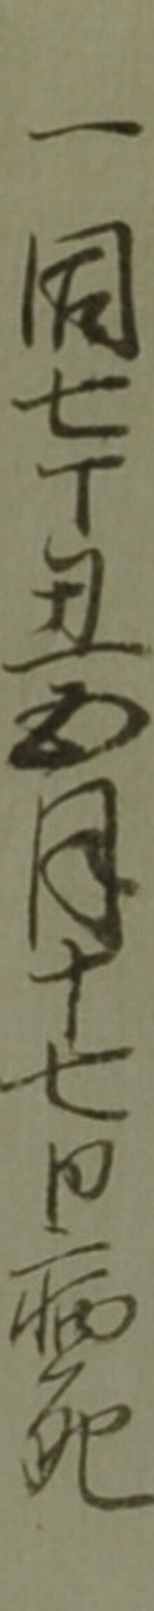一同七丁丑五月十七日病死
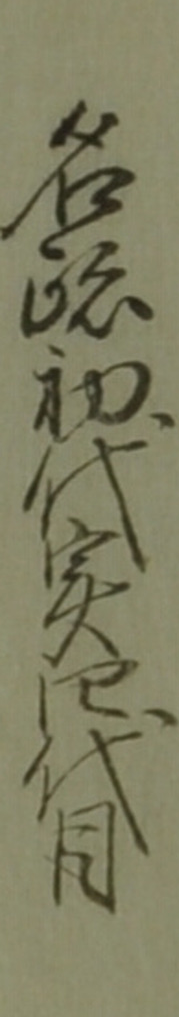名跡初代実四代目
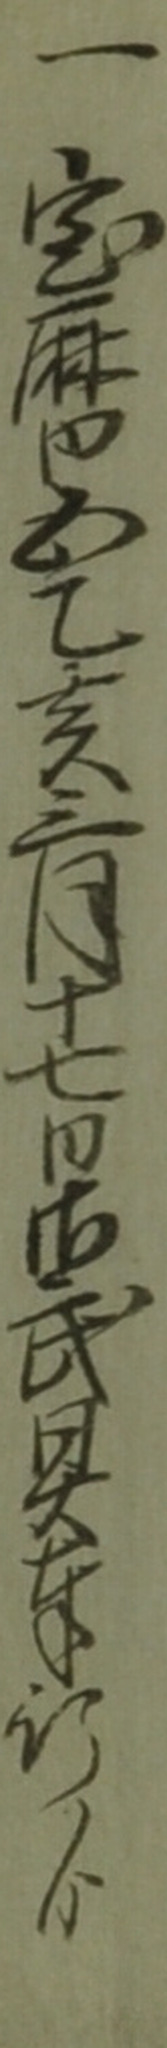一宝暦五乙亥三月十七日御武具奉行ゟ
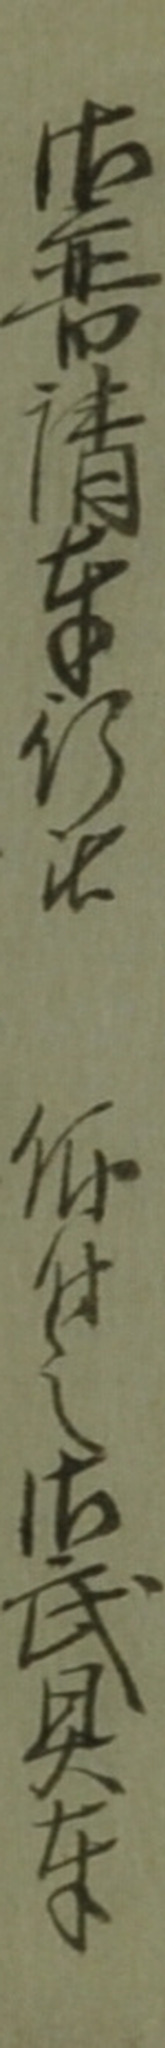御普請奉行被仰付之御武具奉
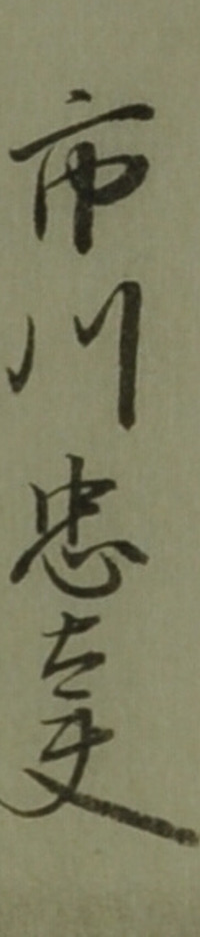市川忠太夫
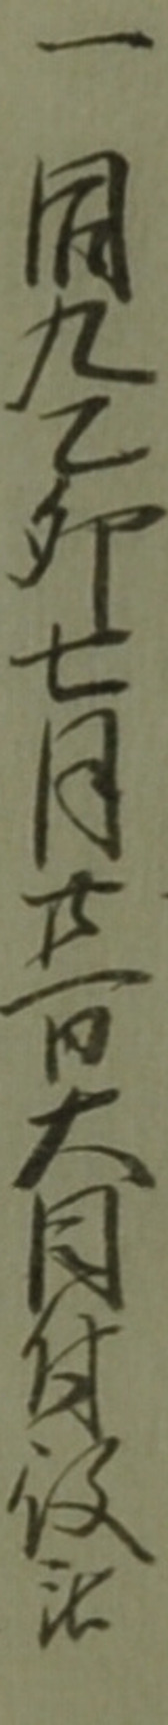一同九乙卯七月廿一日大目付役被
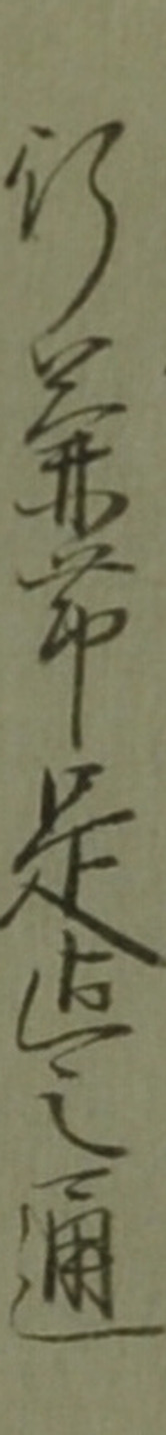行兼帯是迄之通
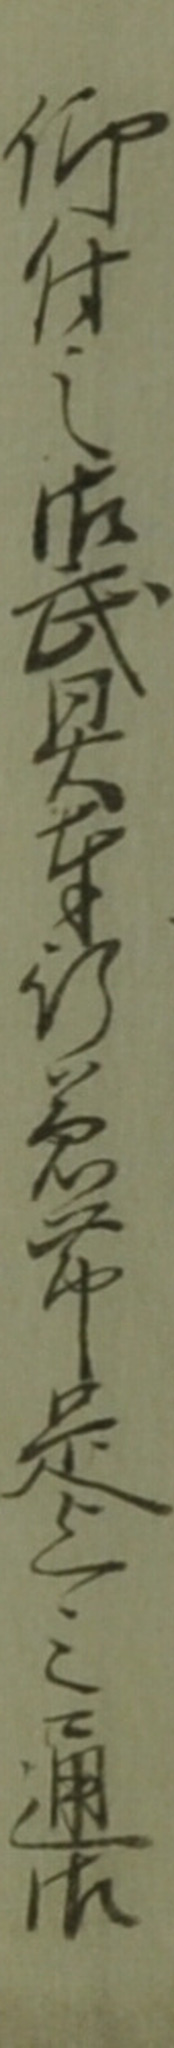仰付之御武具奉行兼帯是迄之通御
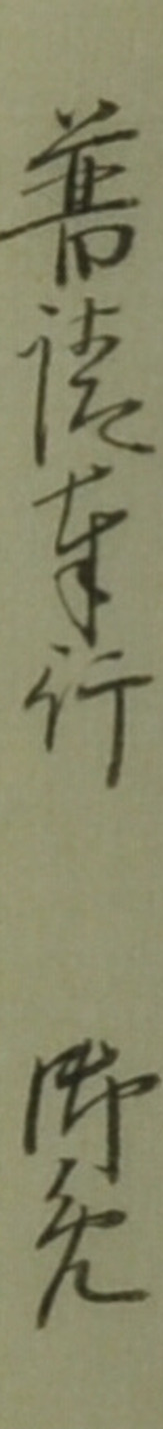普請奉行御免

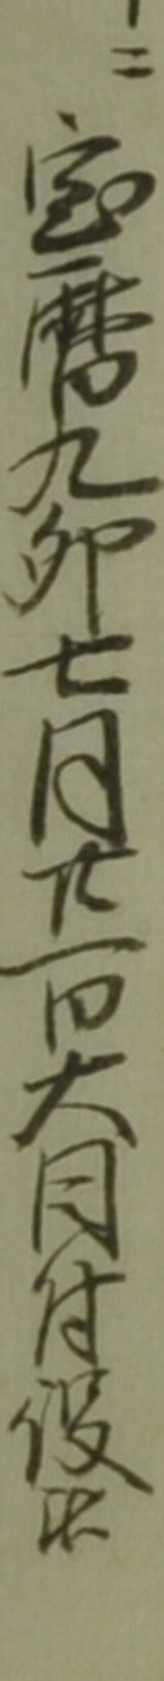宝暦九卯七月廿一日大目付役被
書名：諸御役代々録（六）
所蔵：伊那市立高遠町図書館・合同会社AMANE
